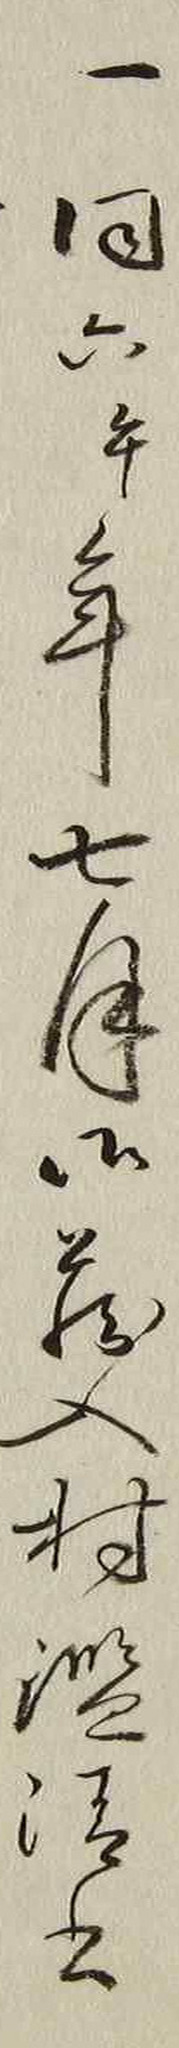一同六午年七月御蔵入村鑑清書
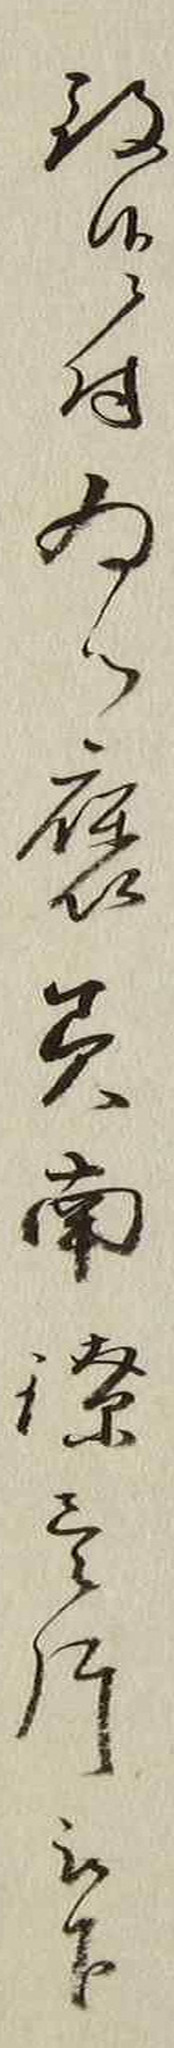致候ニ付為御褒美南鐐壱片被下
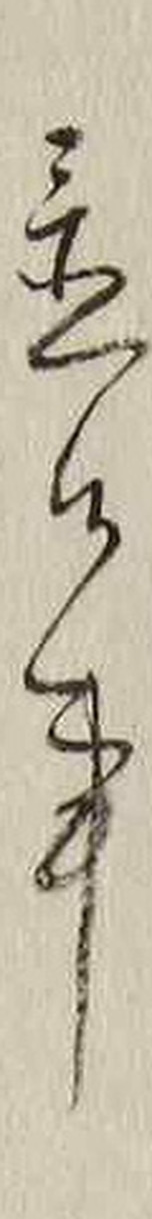置候事
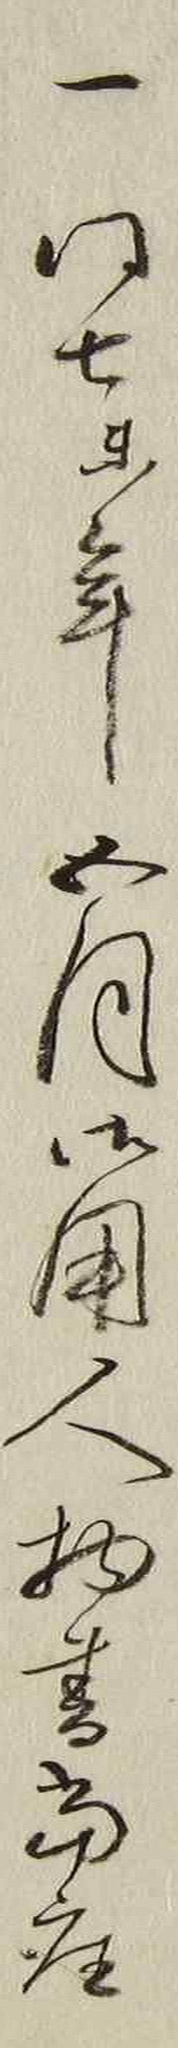一同七未年五月御用人物書当座
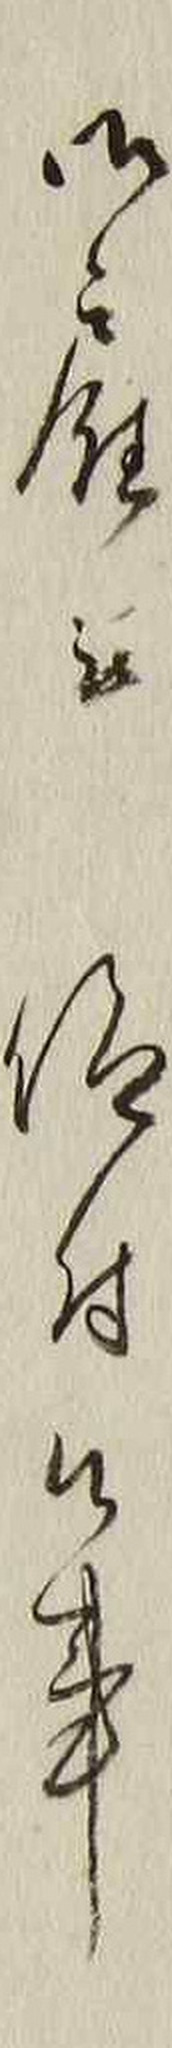御雇被仰付候事
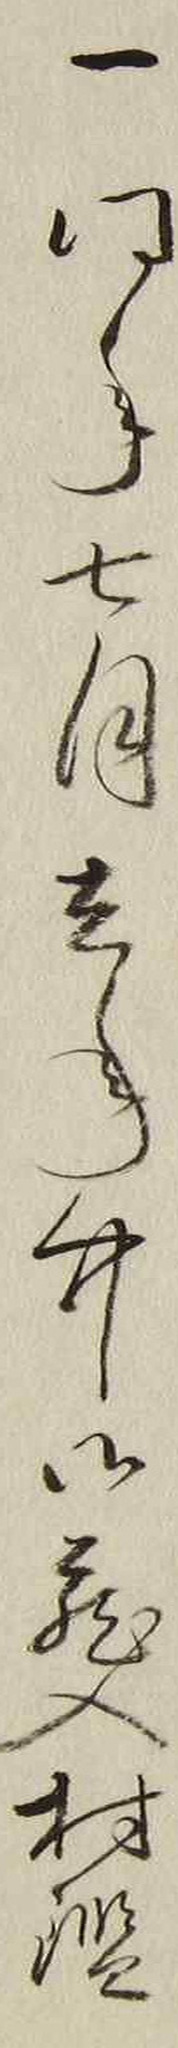一同年七月去年中御蔵入村鑑
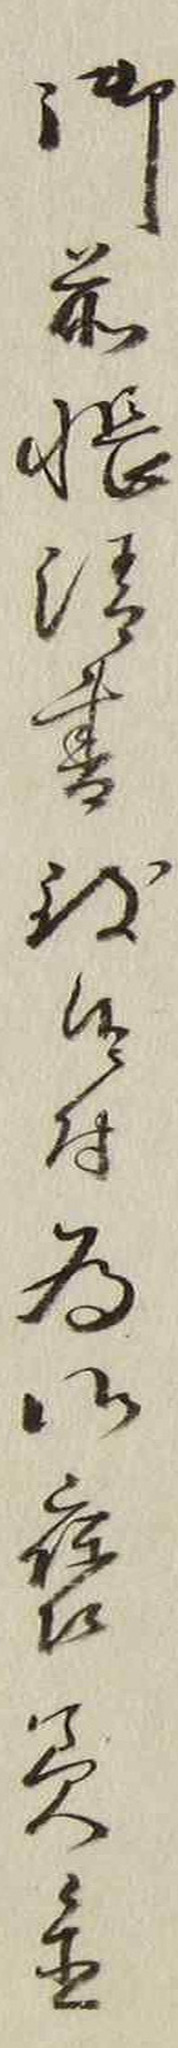御前帳清書致候ニ付為御褒美金
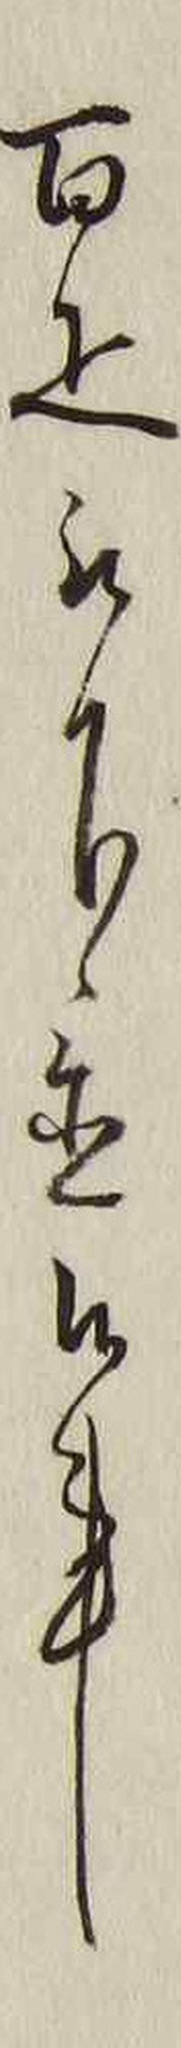百疋被下置候事

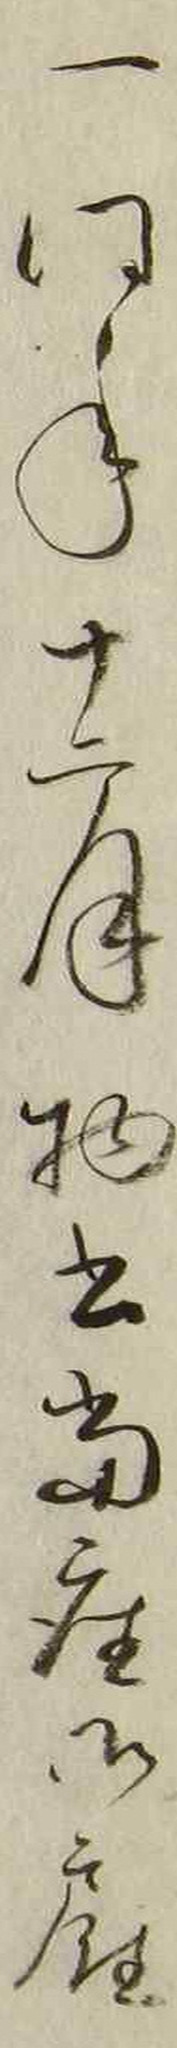一同年十二月物書当座御雇
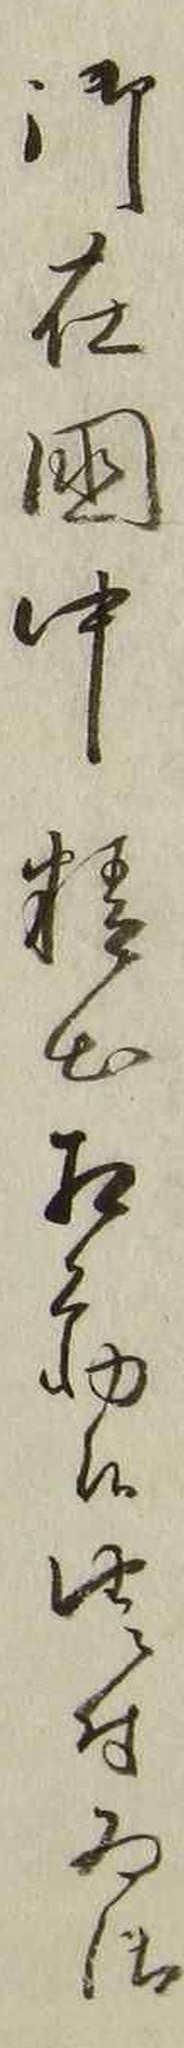御在国中精出相勤候由ニ付為御
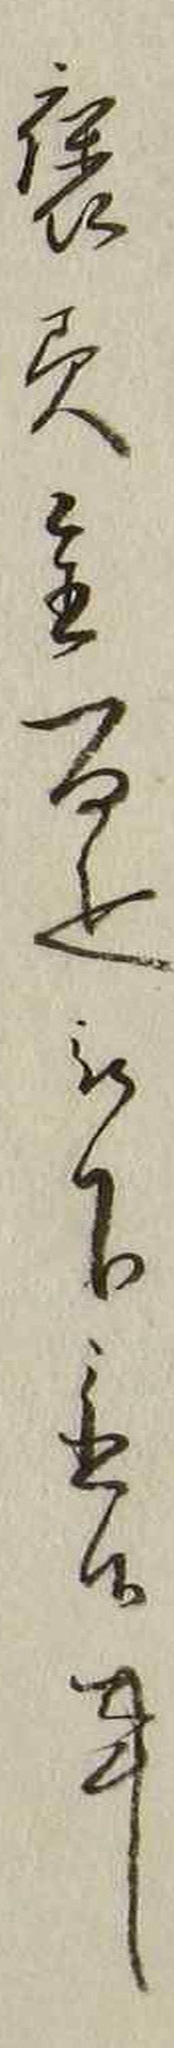褒美金百疋被下置候事
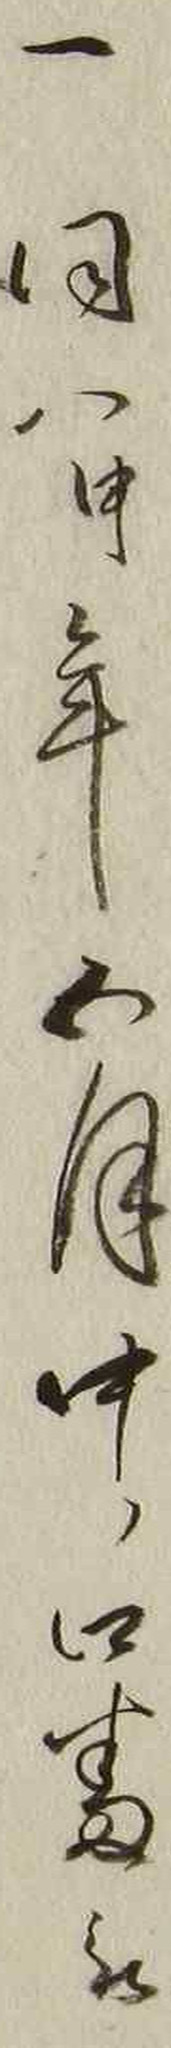一同八申年五月中ノ口番被
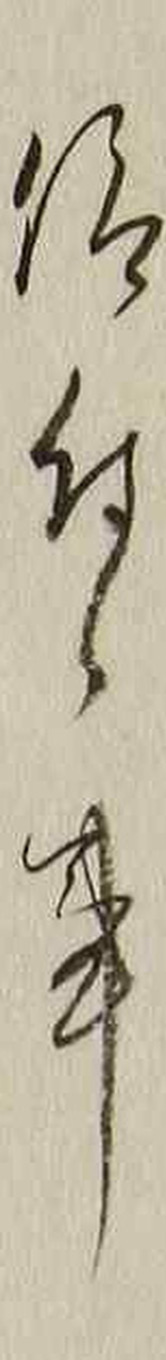仰付候事
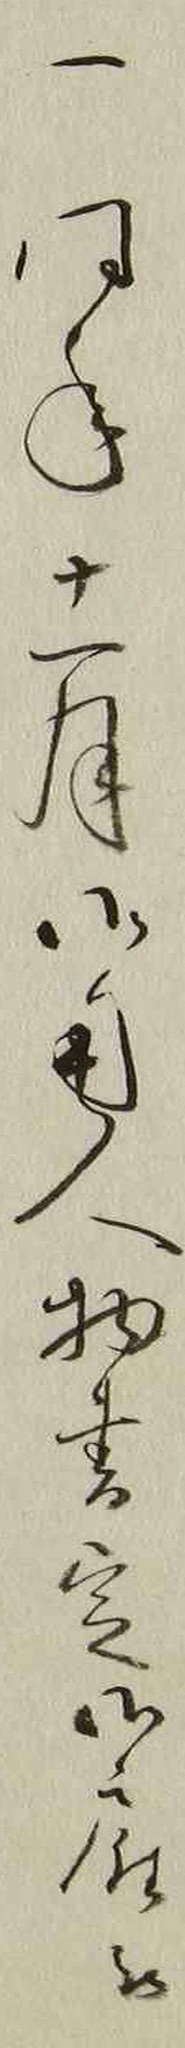一同年十一月御用人物書定御雇被
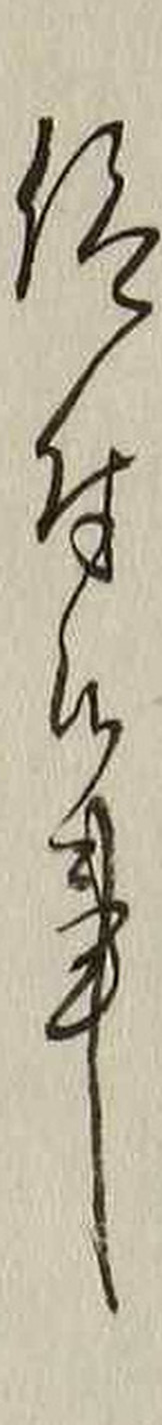仰付候事
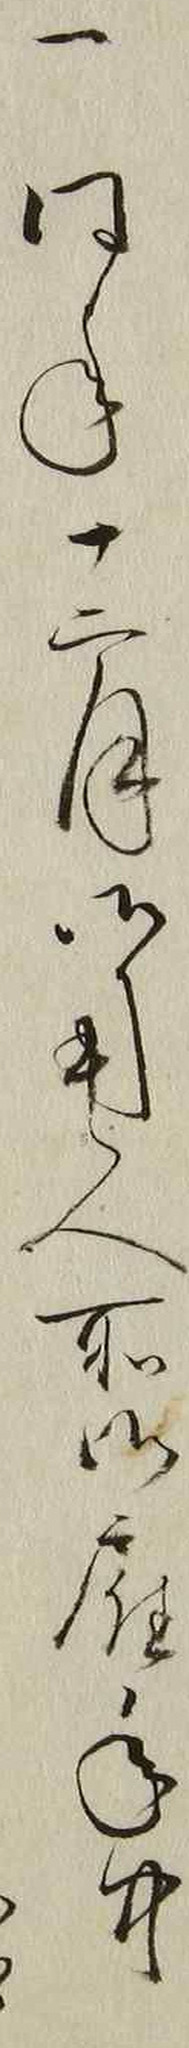一同年十二月御用人所御雇年中
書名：諸士系譜　巻之10　い之部10
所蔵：会津若松市立会津図書館
